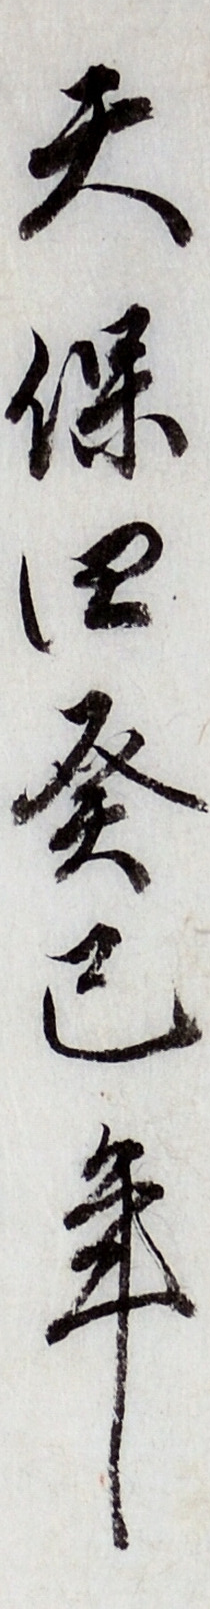天保四癸巳年
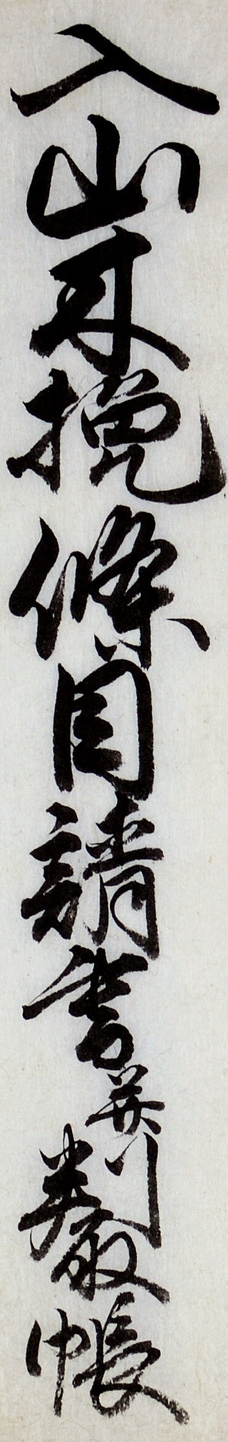入山木挽條目請書并判取帳
